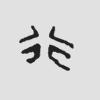行
